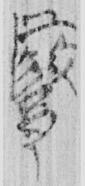○（殷）
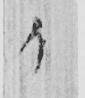人
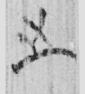之
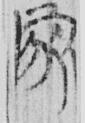所
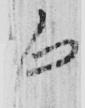㠯（以）
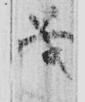弋（代）
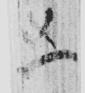之
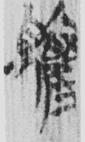○（觀）
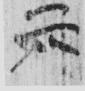亓（其）
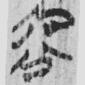容
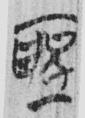聖（聽）
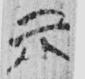亓（其）
